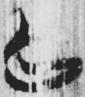㠯（以）
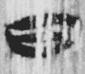日
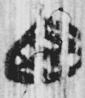西
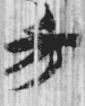方
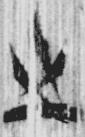之
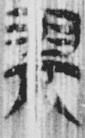○（旗）
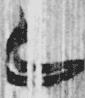㠯（以）
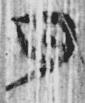月
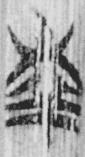南
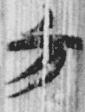方
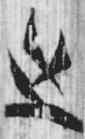之
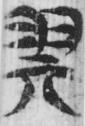○（旗）
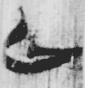㠯（以）
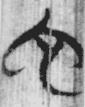它（蛇）
